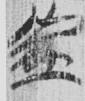○（吾）
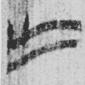亡（無）
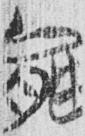能
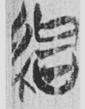○（治）
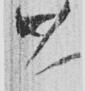也
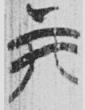而
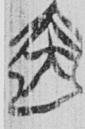因
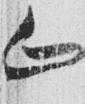㠯（以）
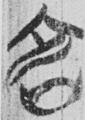害
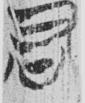君
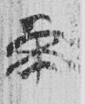不
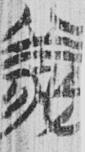義
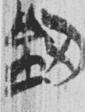○（刑）
